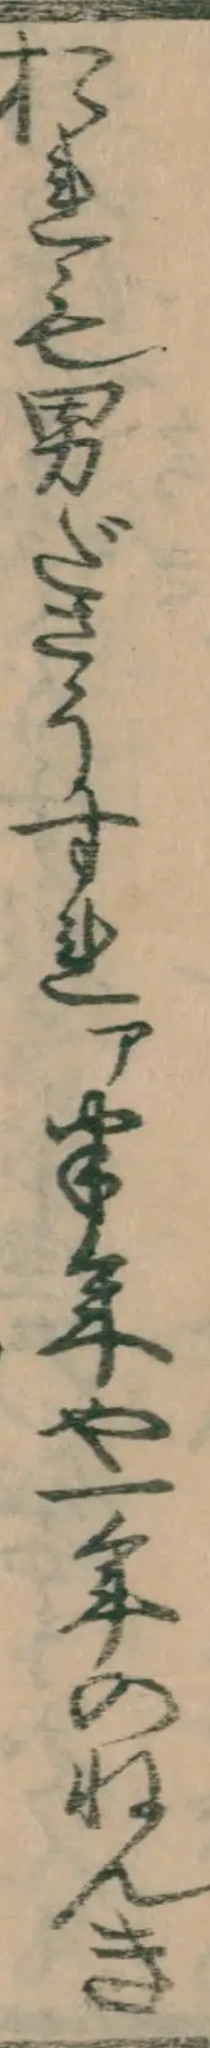おれも男ださうすれァ半年や一年のねんき
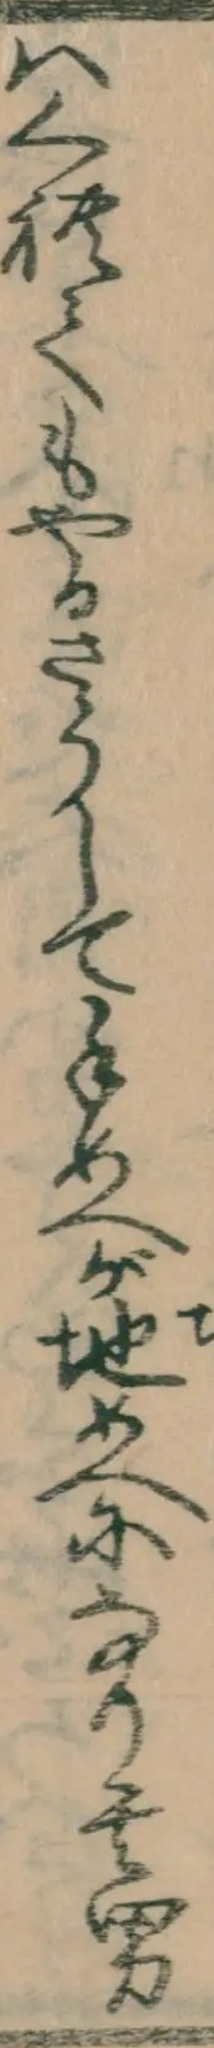はくれてもやるさうして手めへが地めへになり其男
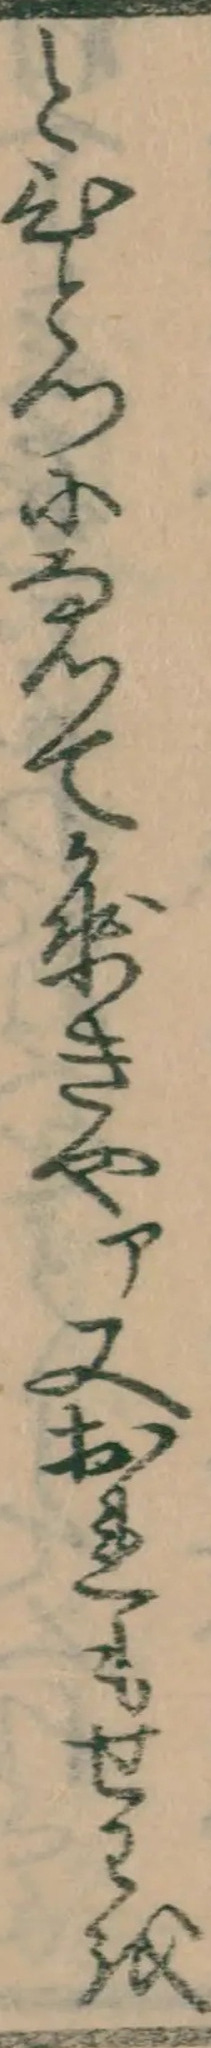とひとつになつてかせきやア又おれもせわを
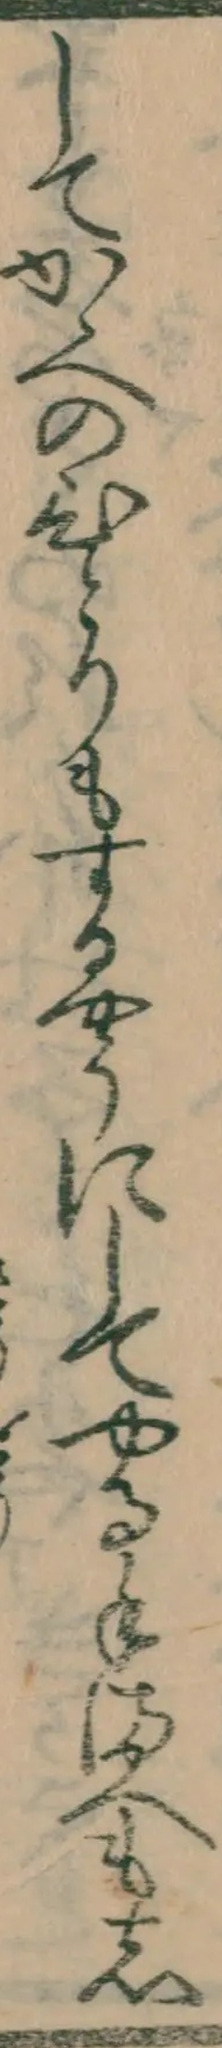してかゝへのひとりもするやうにしてやる手まへもし
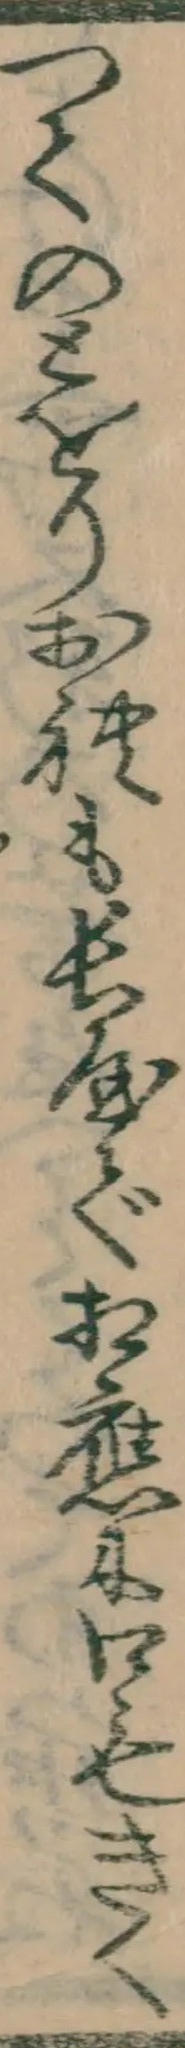つてのとをりおれも長屋で相応に口もきく
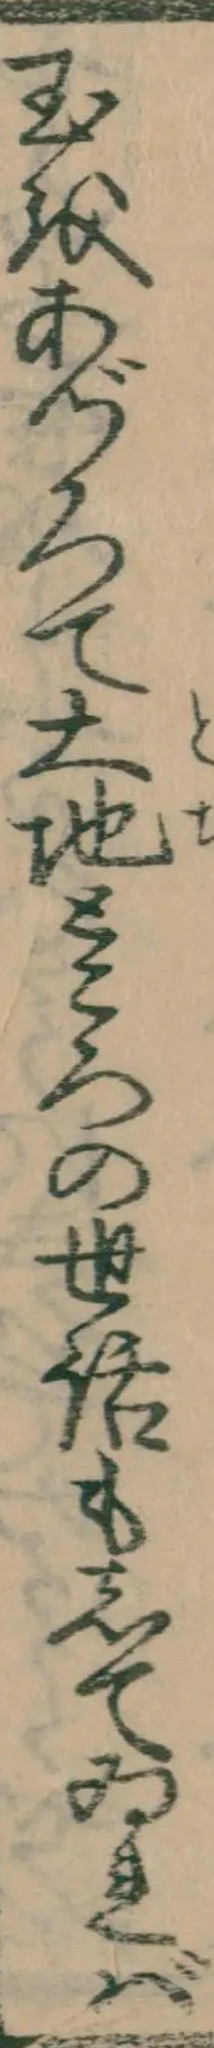玉をあづかつて土地ところの世話もしてゐれば
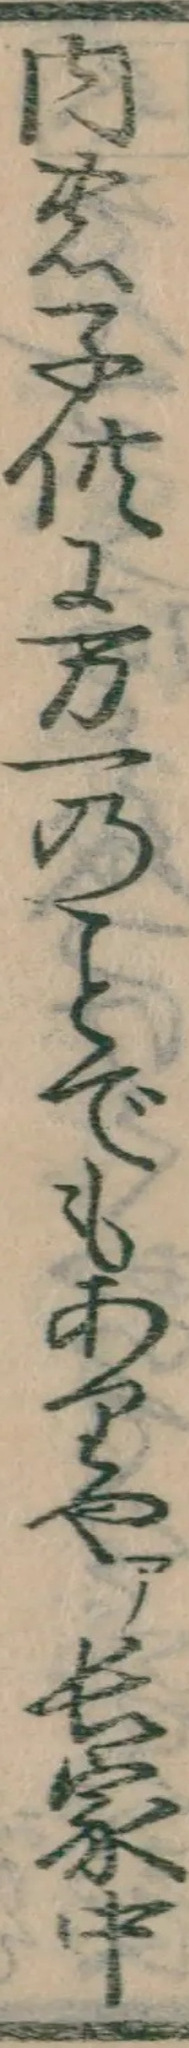内の子供に万一のことでもありやァ長家中
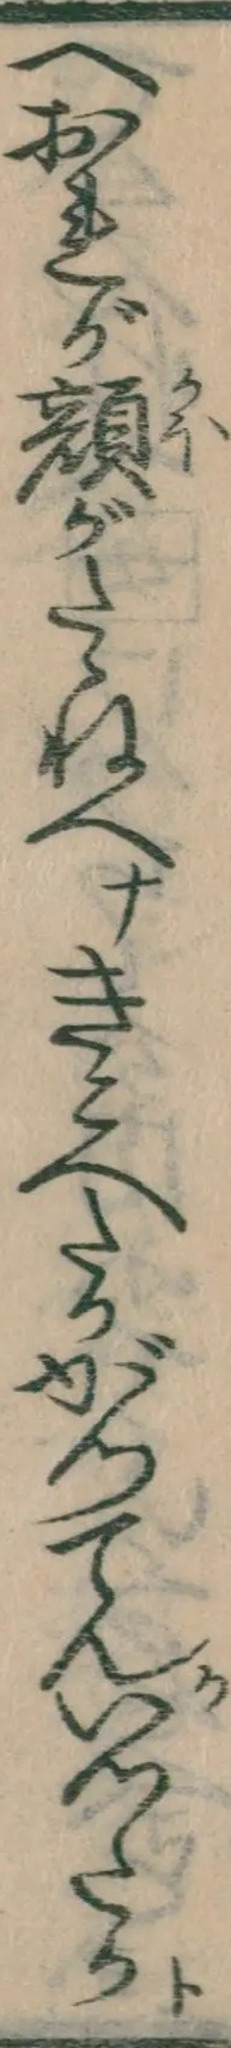へおれが顔がたゝねへナきこへたかがつてんかいつたかト
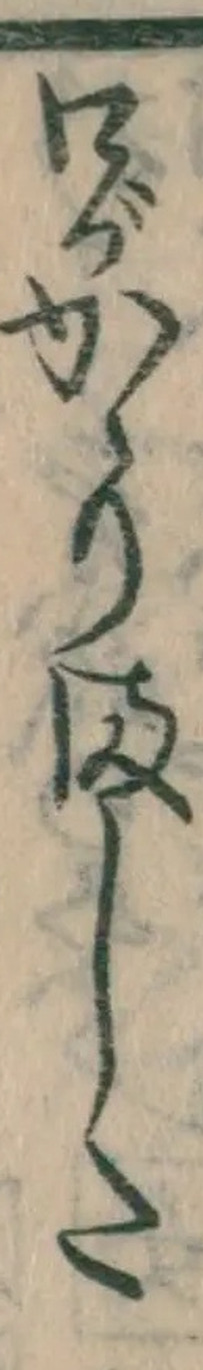口がかゝりました
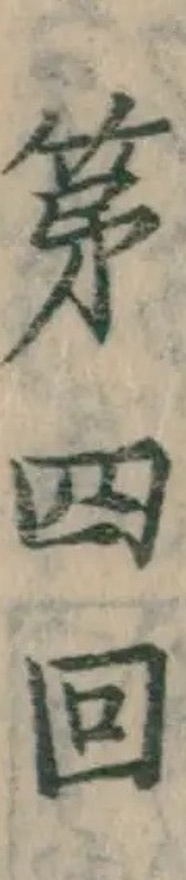第四回
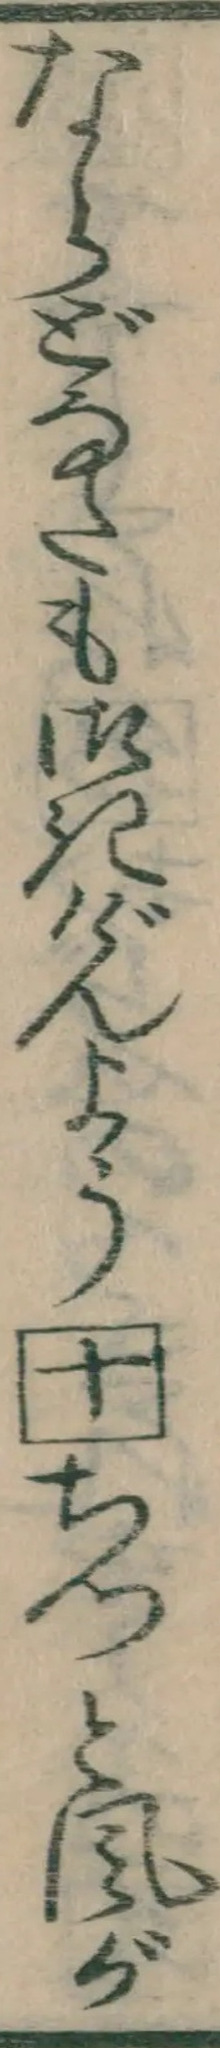ならどなたも御きげんよう〈十〉ちつと風が

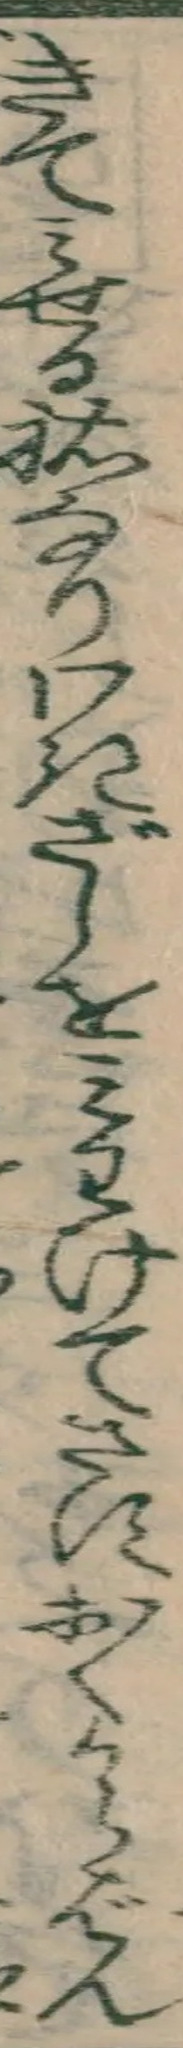きてみせる祐なりわきざしをみわけてさすおくからばん
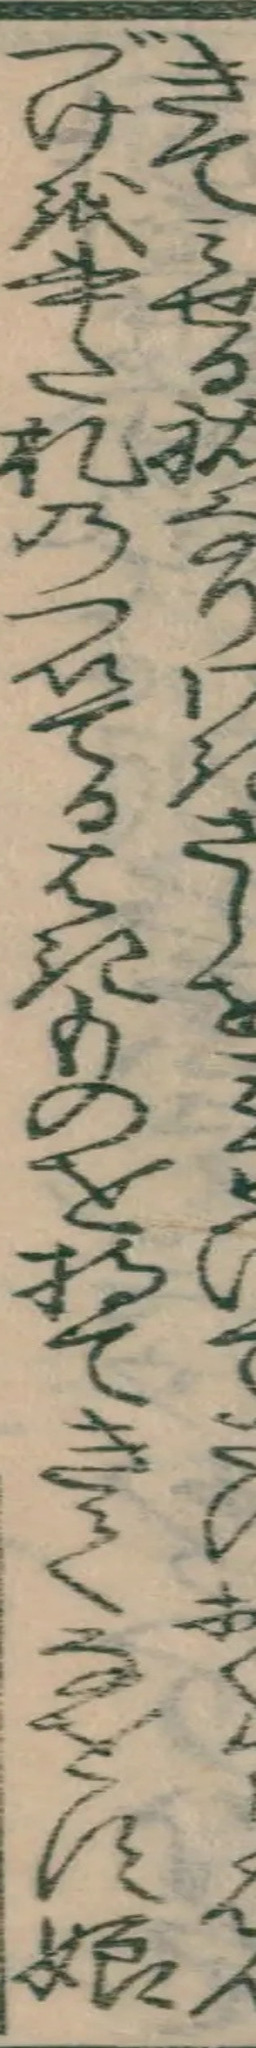づけを書た札のついてるはきものを持てきてなををす娘
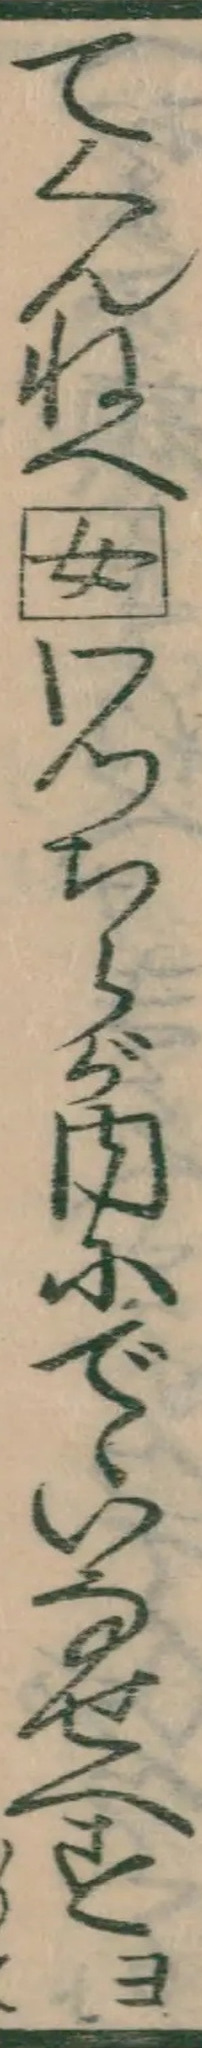てくんねへ〈女〉わつちらが内にでゝいなせへすヨ
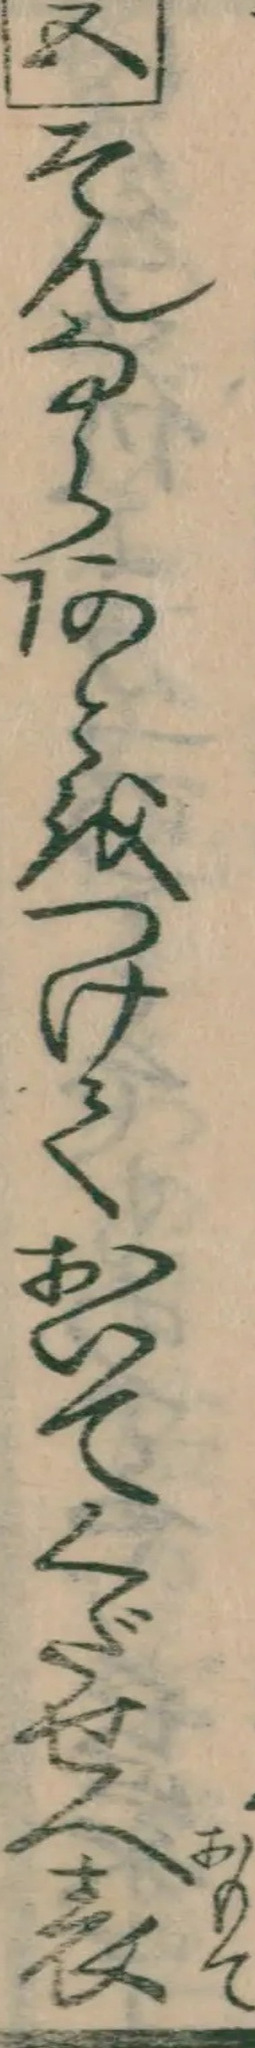〈五〉そんならあとをつけておいてくだせへ表
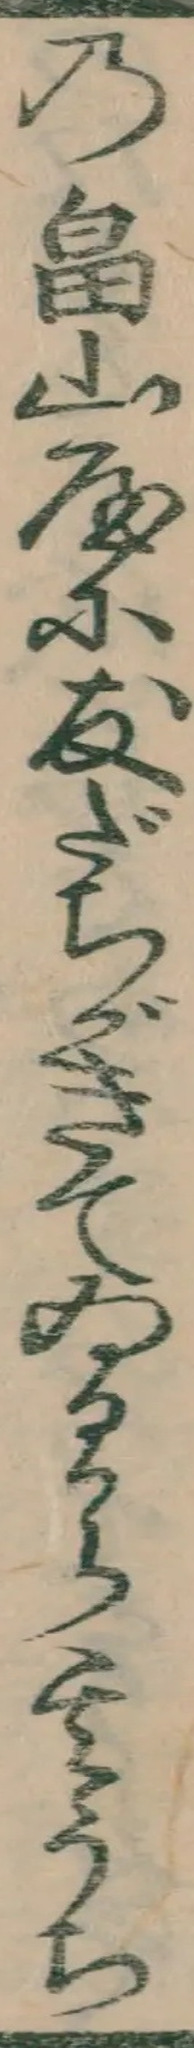の畠山屋に友だちがきてゐるから其うち
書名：教訓読本：大礒風俗仕懸文庫
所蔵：国立国会図書館 National Diet Library, JAPAN
